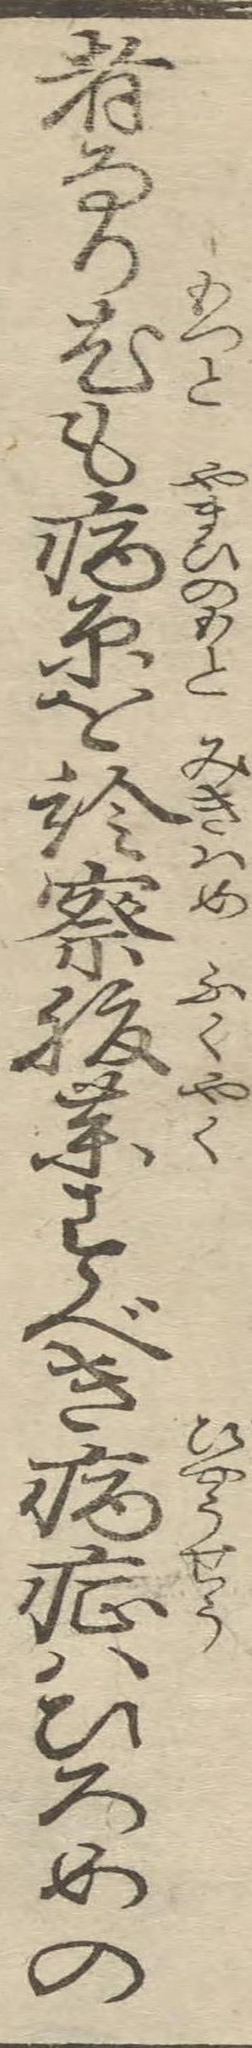者なり尤も病原を診察服薬すべき病症はひろめの
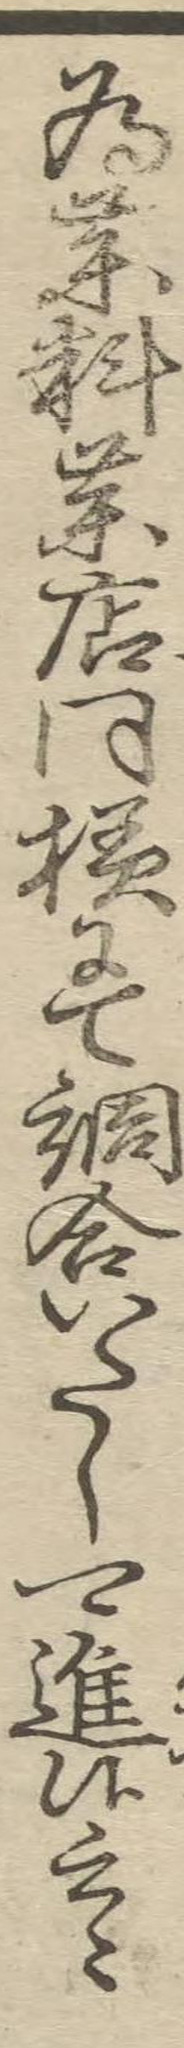為薬料薬店同様にて調合いたし可進候云々

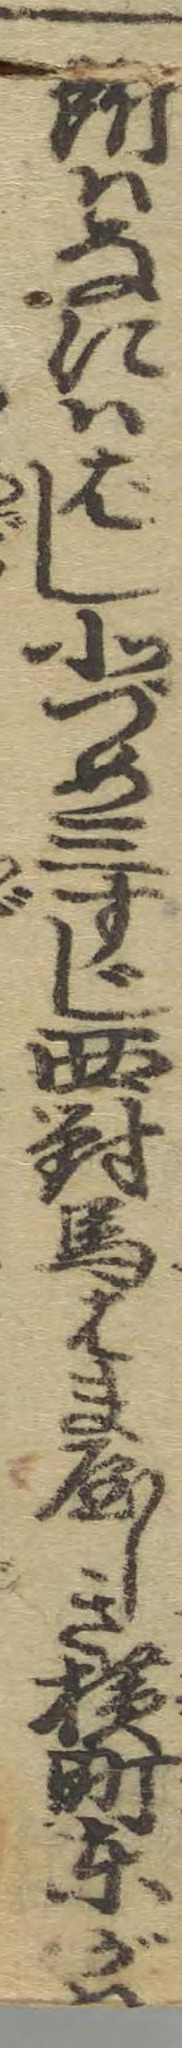所はなにはばし北づめ三すじ西対馬はまやしき横町東がは
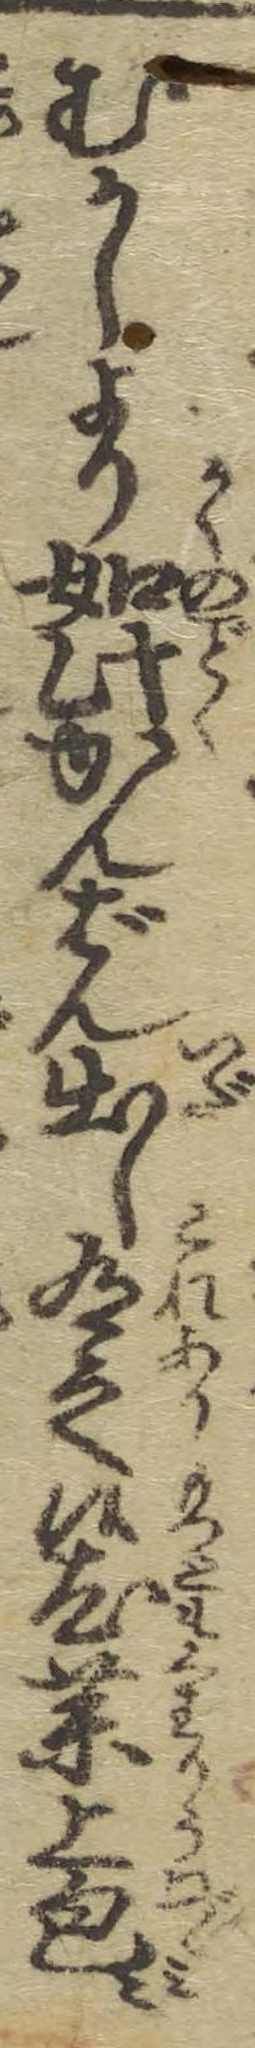むかしより如此かんばん出し有之候尤薬上包ニ
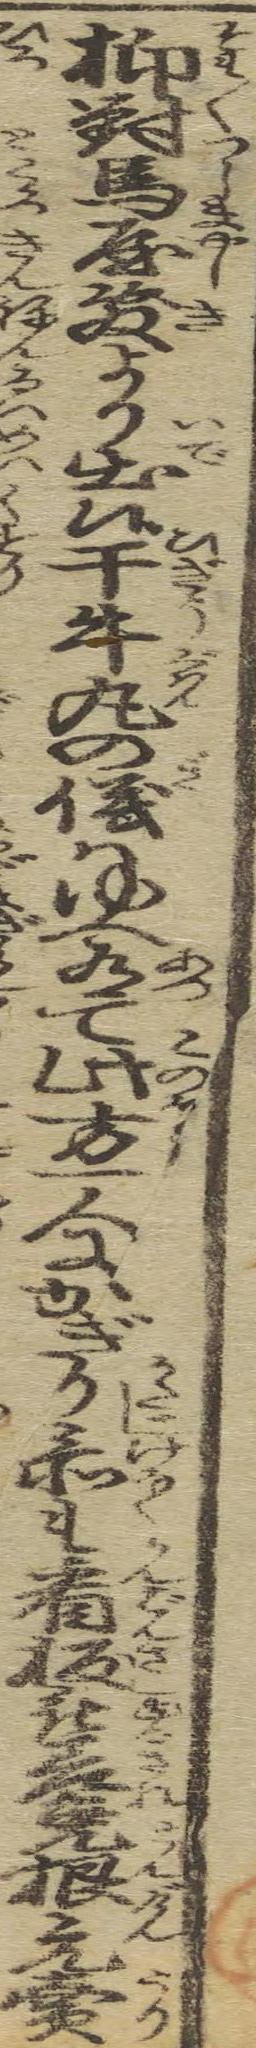抑対馬屋敷より出候干牛丸の儀はゆへ有て此方一人にかぎり忝も看板被差免根元売
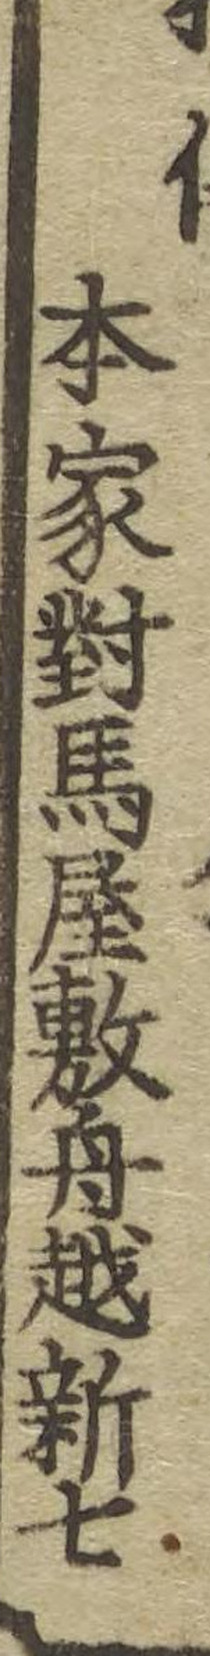本家対馬屋敷舟越新七
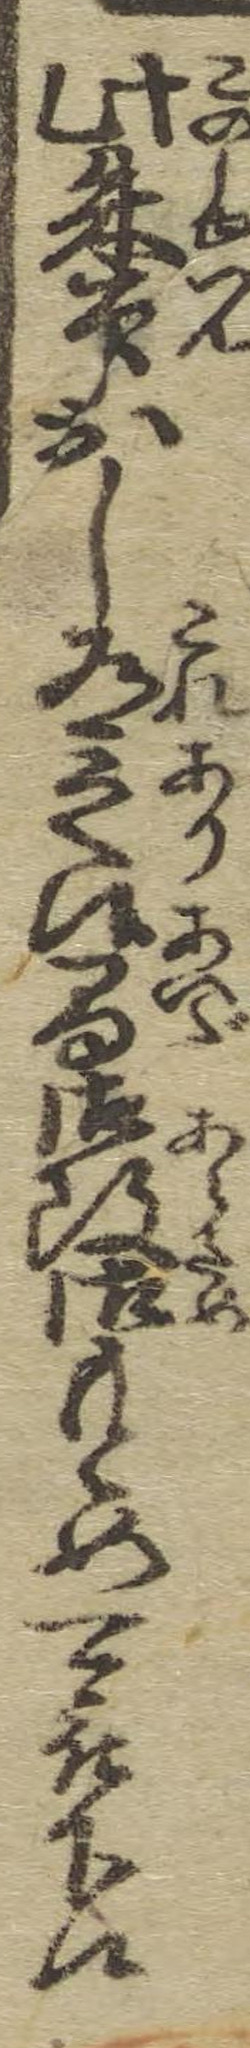此朱印おし有之候間御改御もとめ可被下候
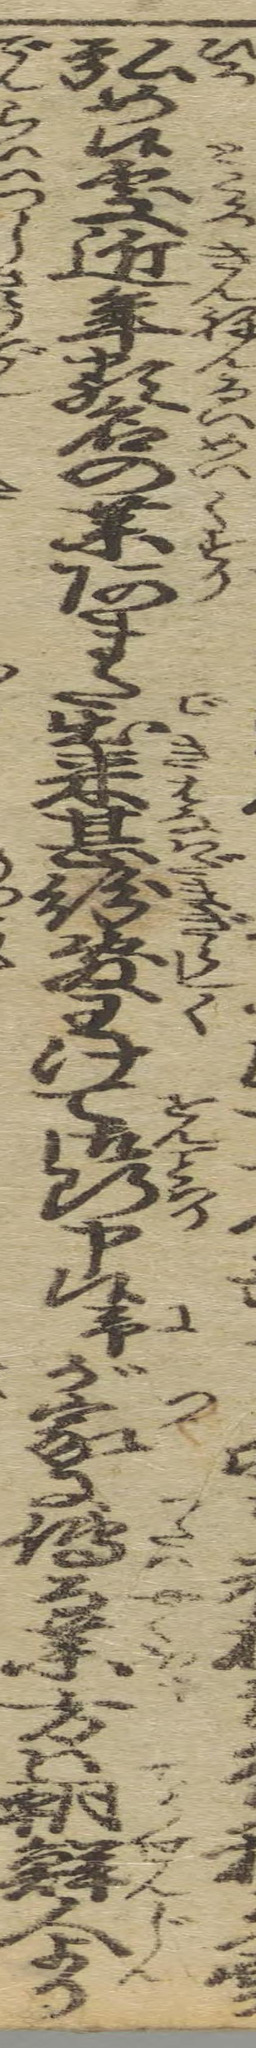弘め候処近年類名の薬あまた出来甚紛敷わけて御断申候予が家に伝る薬方は朝鮮人より
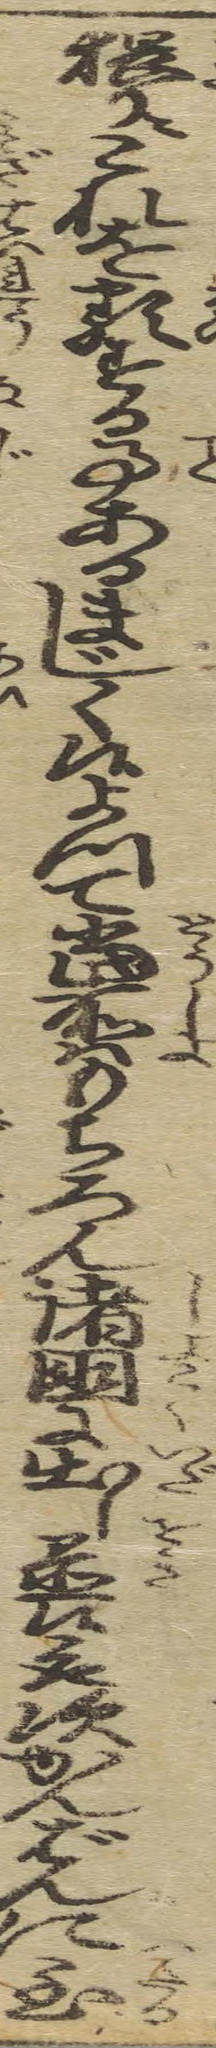猥りニこれを類する事あるまじく候よつて当所はもちろん諸国に出し置候取次かんばんに至
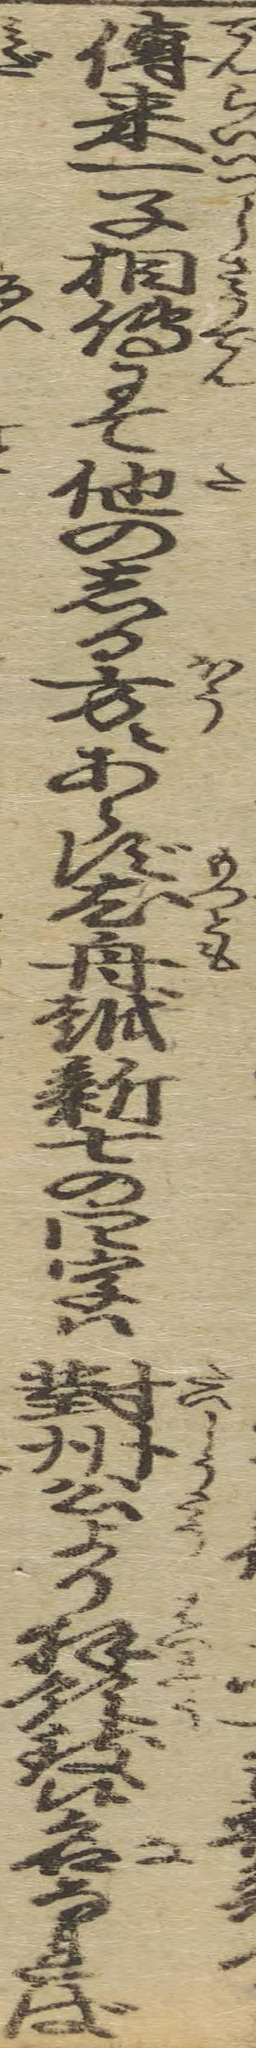伝来一子相伝にて他のしる方ニあらずも尤舟越新七の四字は対州公より拝領致候名なれば
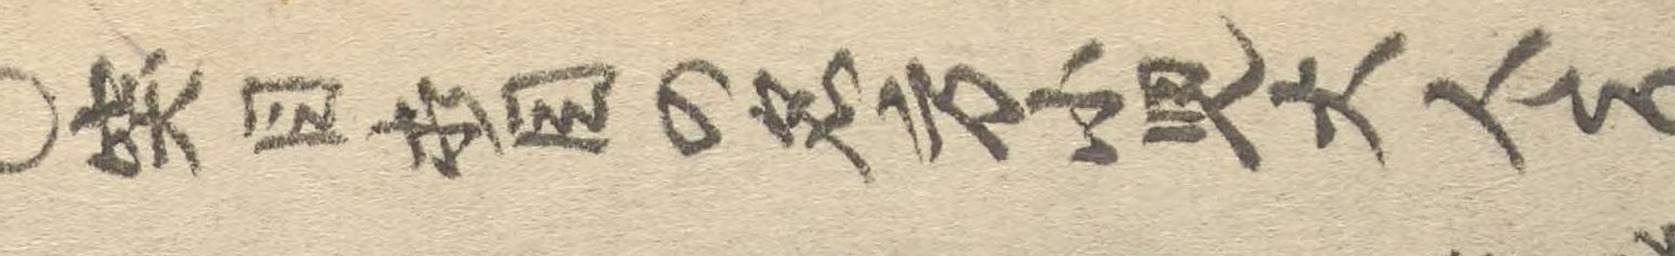○突目目の名方小児大人たりと
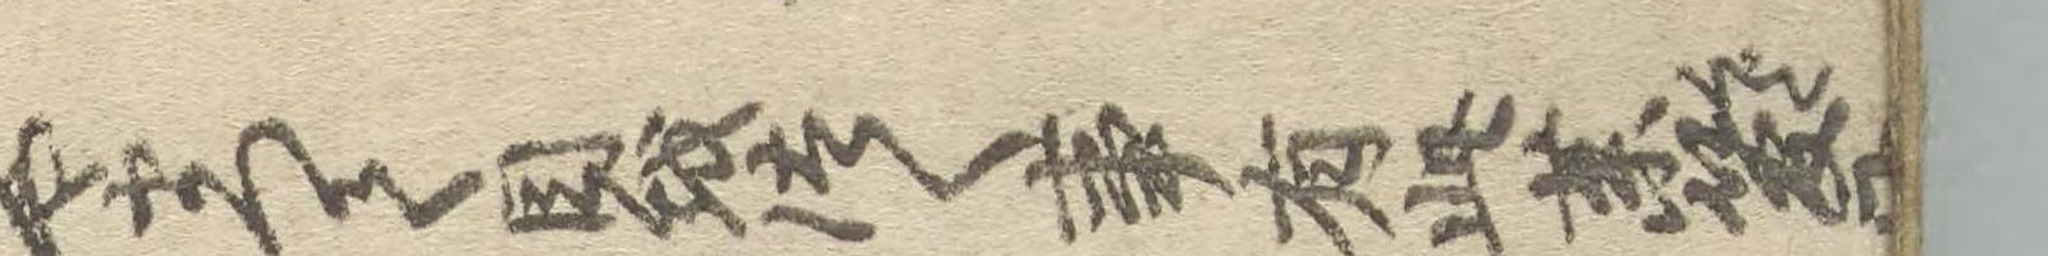あやまつて目をつく事有此薬管
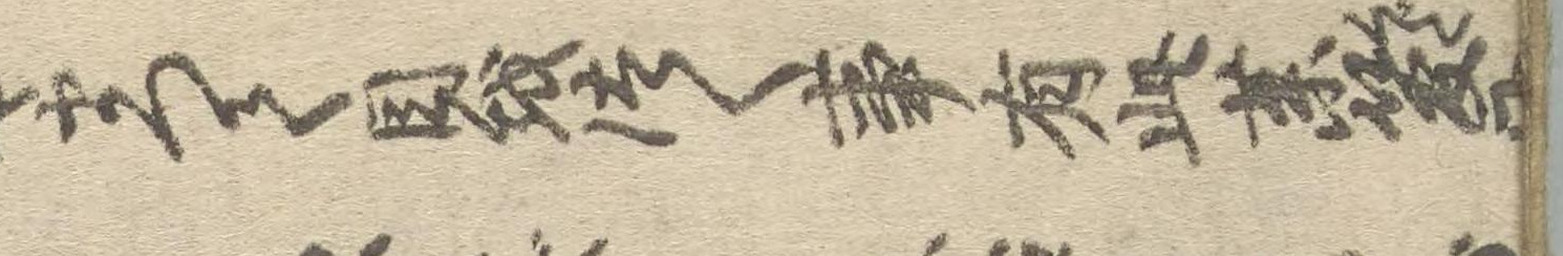あやまつて目をつく事有此薬管
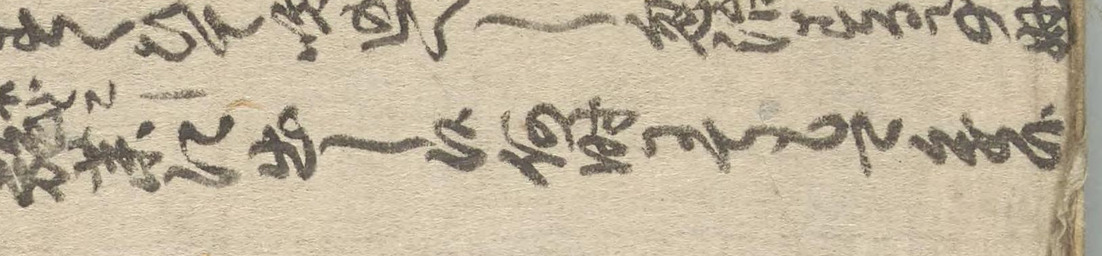施薬出し候何時にても可進候
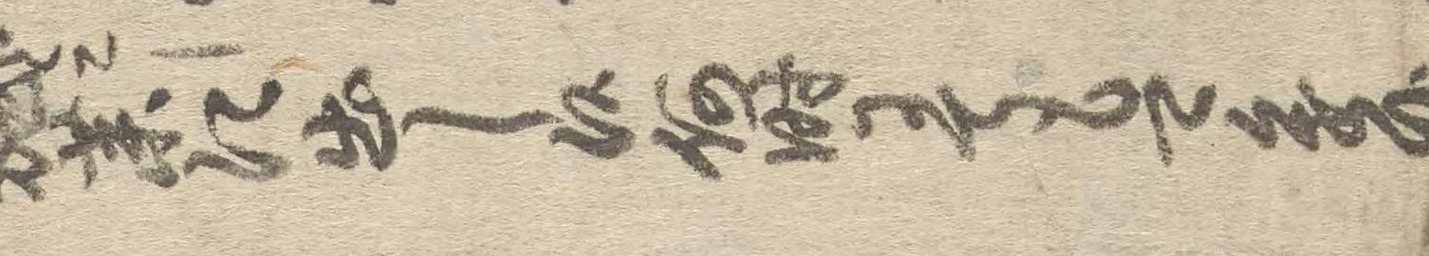施薬出し候何時にても可進候
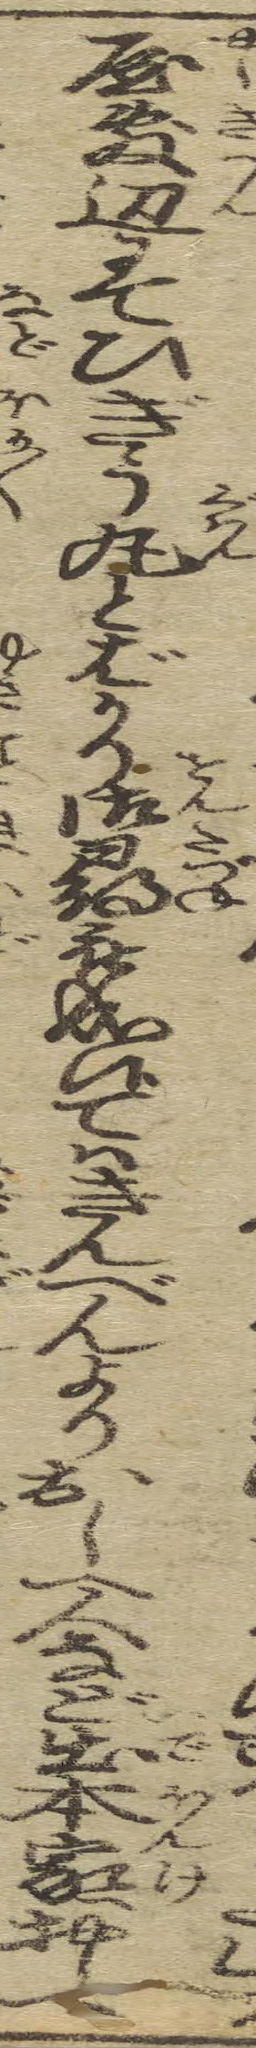屋敷辺にてひぎう丸とばかり御尋被成候てはきんべんよりおしへ人など出本家おしへ
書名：浪華薬種問屋能書張交帖. 二
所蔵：国立国会図書館 National Diet Library, JAPAN
